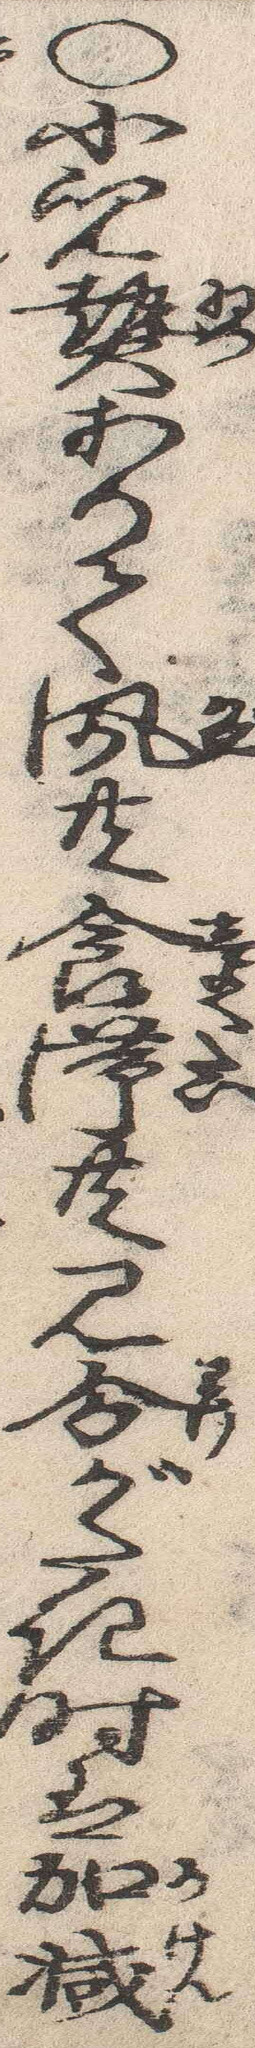○小児熱ありて風共食滞共見分がたき時は加減
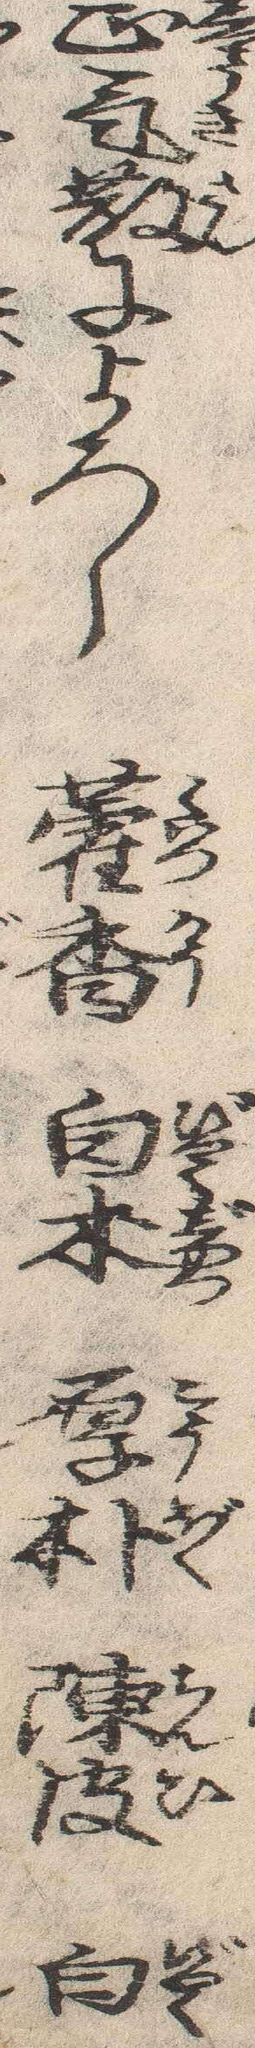正気散によろし藿香白朮厚朴陳皮白
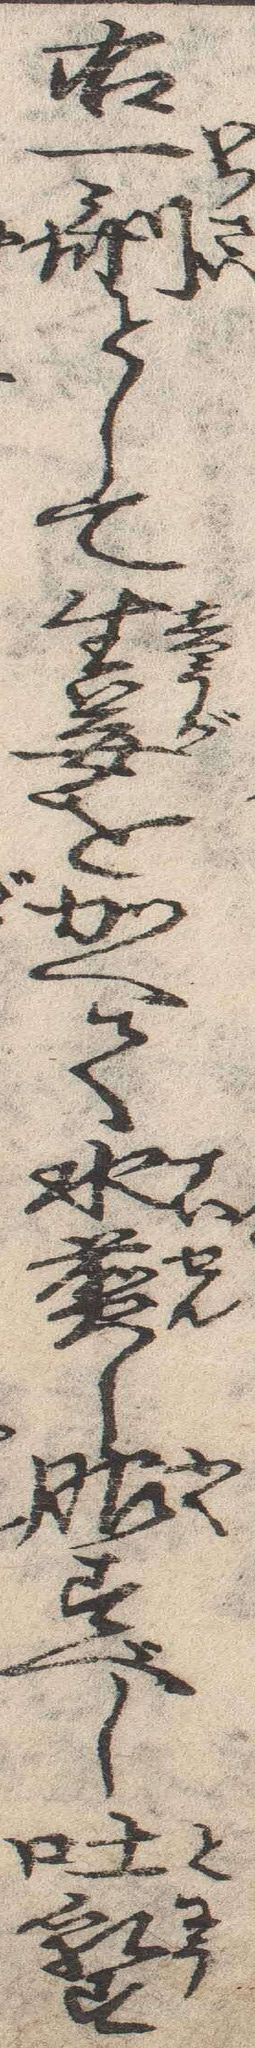右一剤として生姜を加へて水煎し服すべし吐乳す
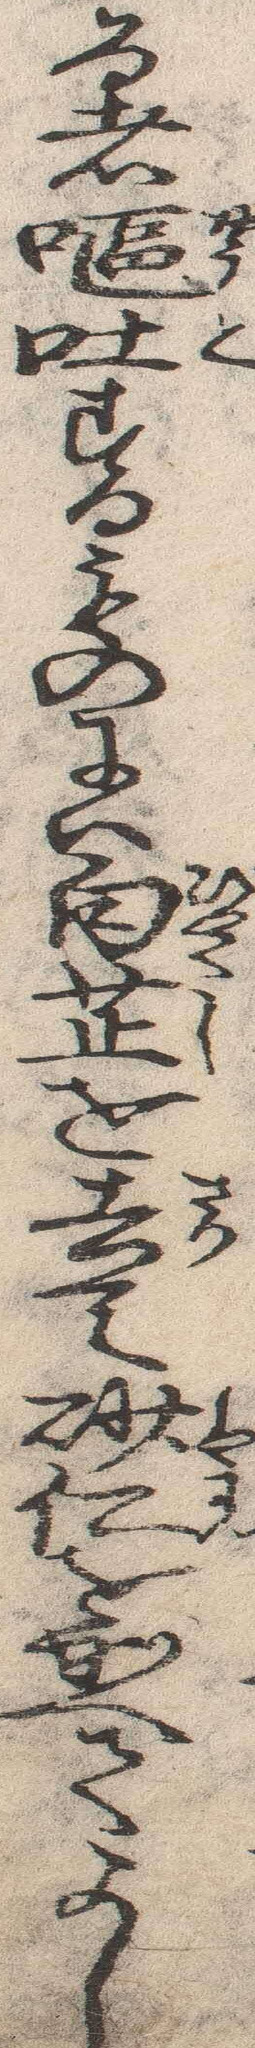る者嘔吐するものには白芷を去て砂仁を加へてよし
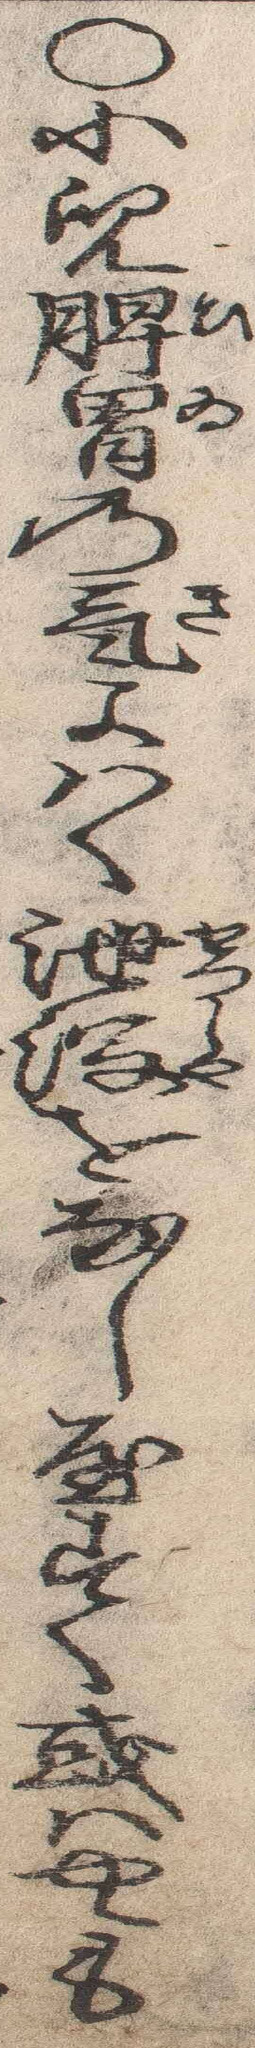○小児脾胃の気よはく泄瀉をなしやすく或はやゝも
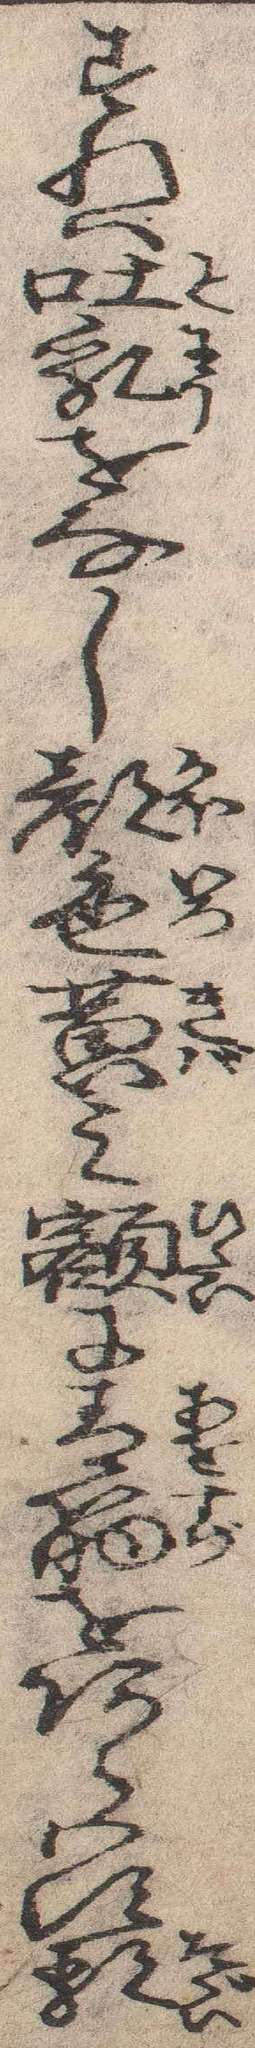すれは吐乳をなし顔色黄み額に青筋をあらはす類

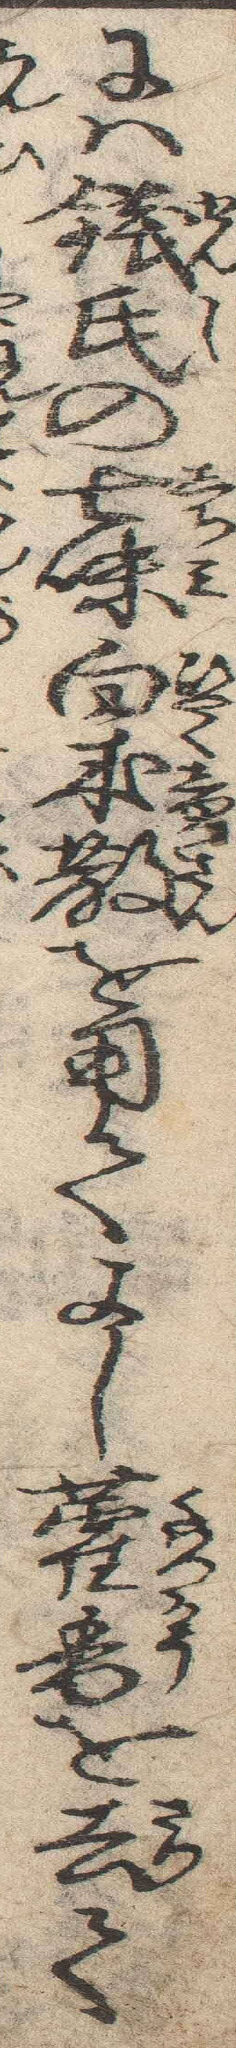には銭氏の七味白朮散を用てよし藿香を去て
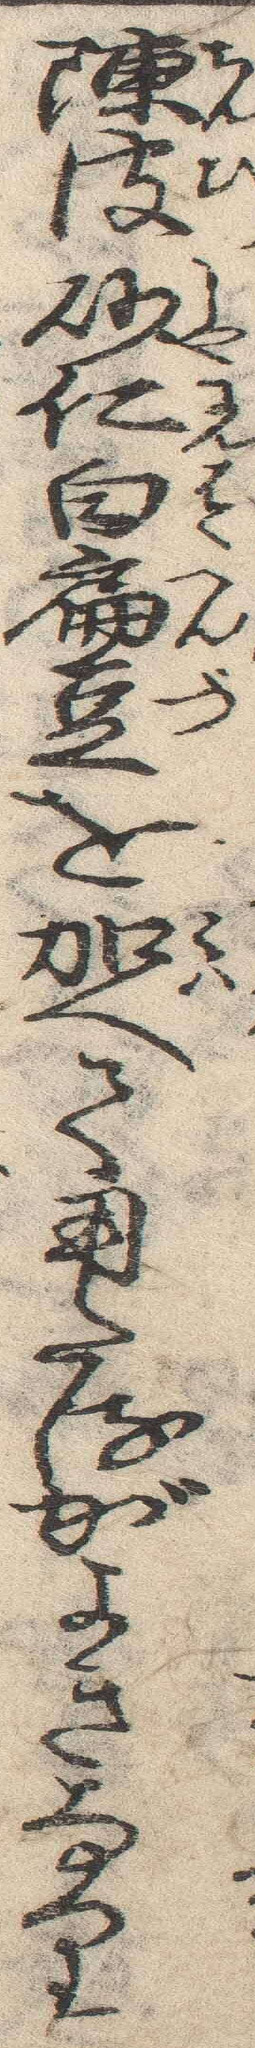陳皮砂仁白扁豆を加へて用たるがよきなり
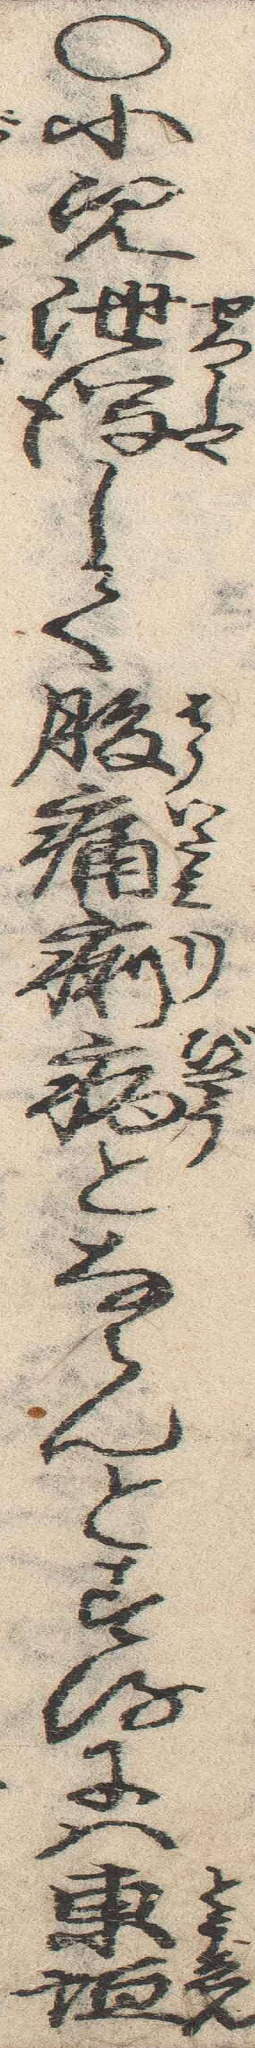○小児泄瀉して腹痛痢病とならんとするには東垣
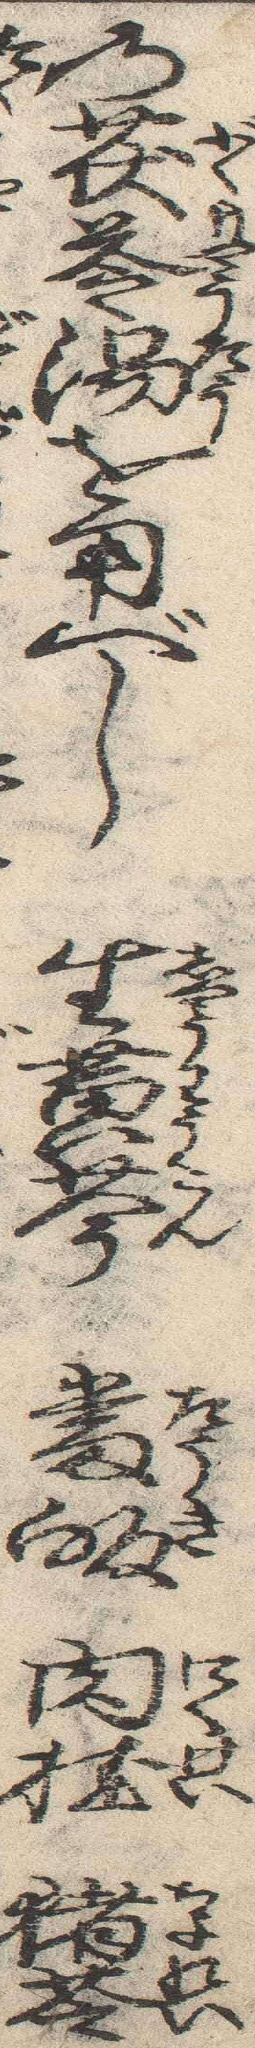の茯苓湯を用べし生黄芩当皈肉桂猪苓
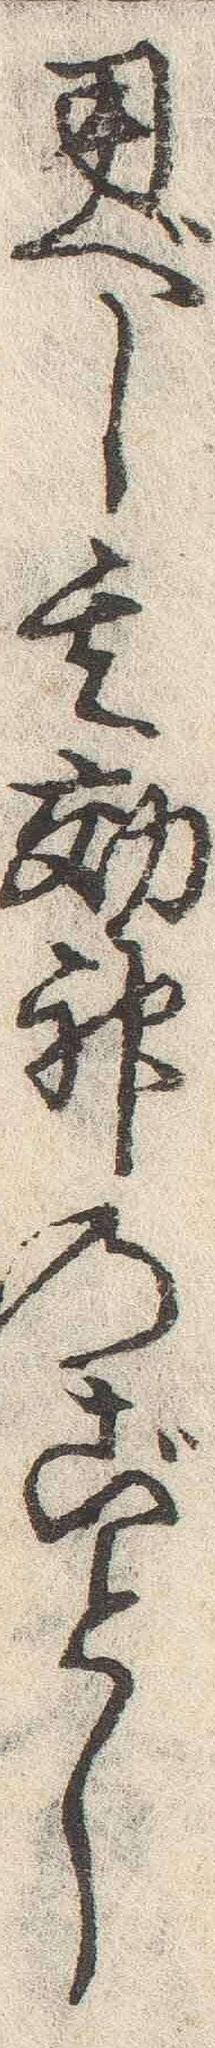用べし其効神のごとし
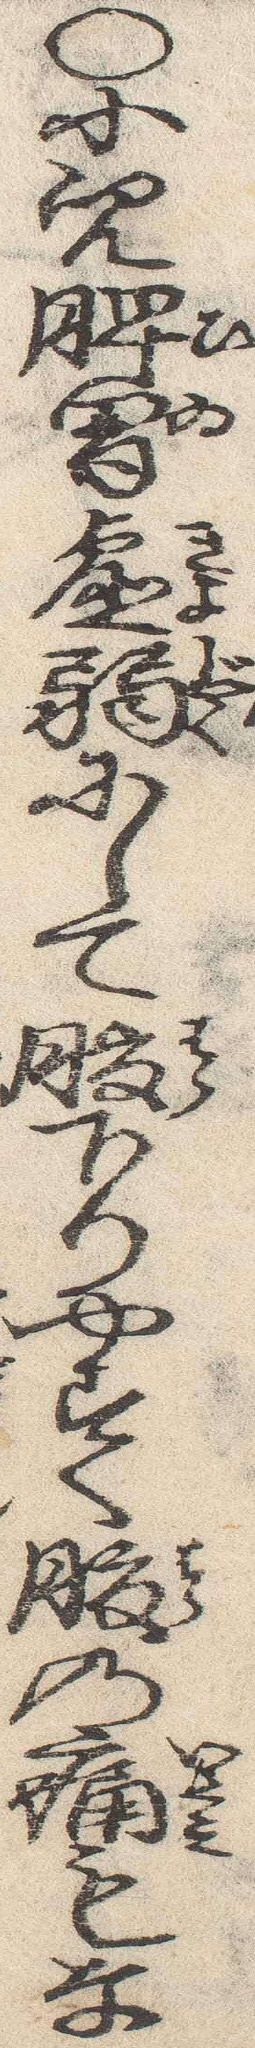○小児脾胃虚弱にして腹下りやすく腹の痛もな
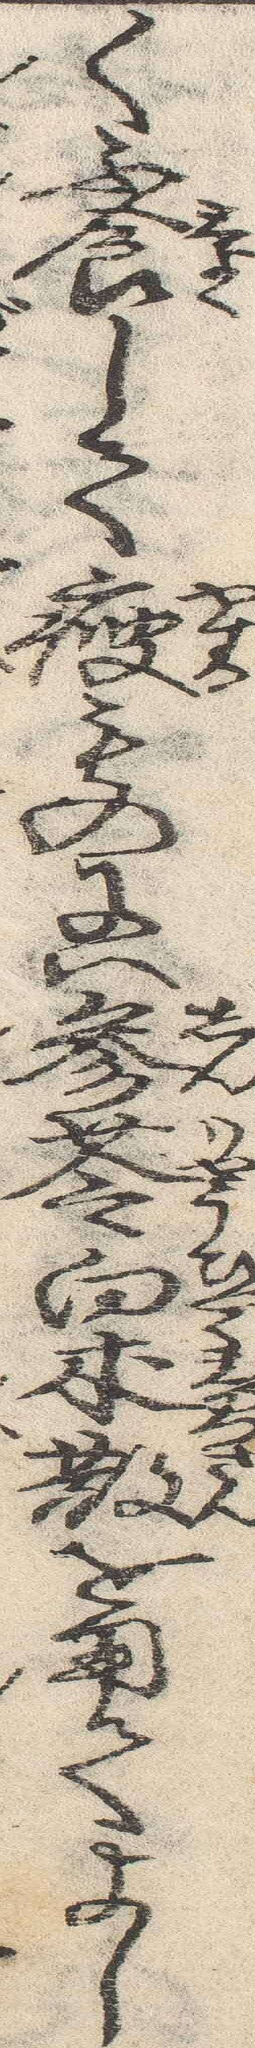く不食して痩ものには参苓白朮散を用てよし
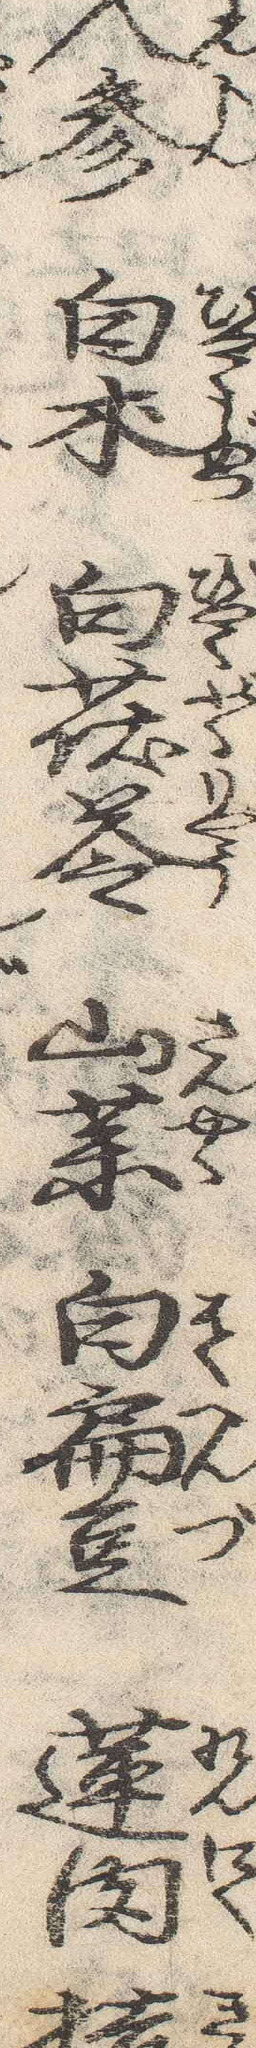人参白朮白茯苓山薬白扁豆蓮肉桔梗
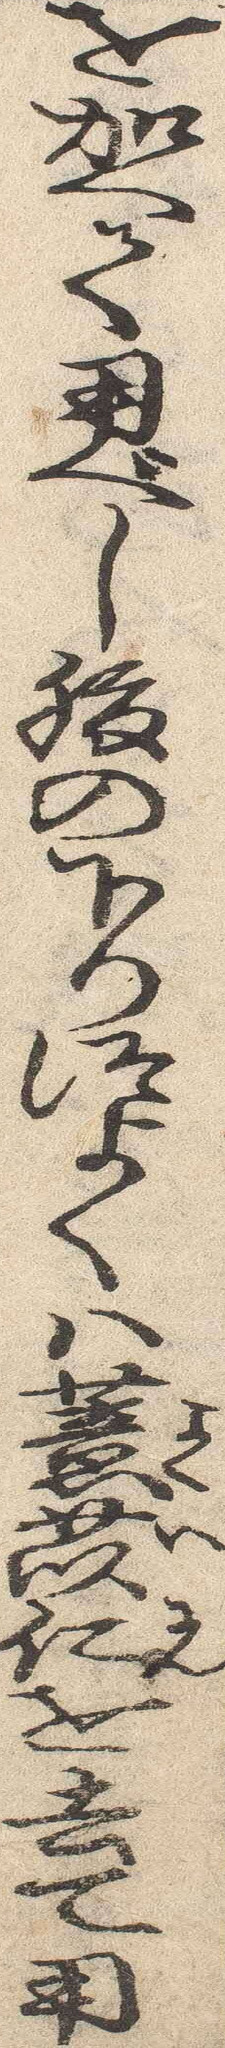を加へて用べし腹の下りつよくは薏苡仁を去て用
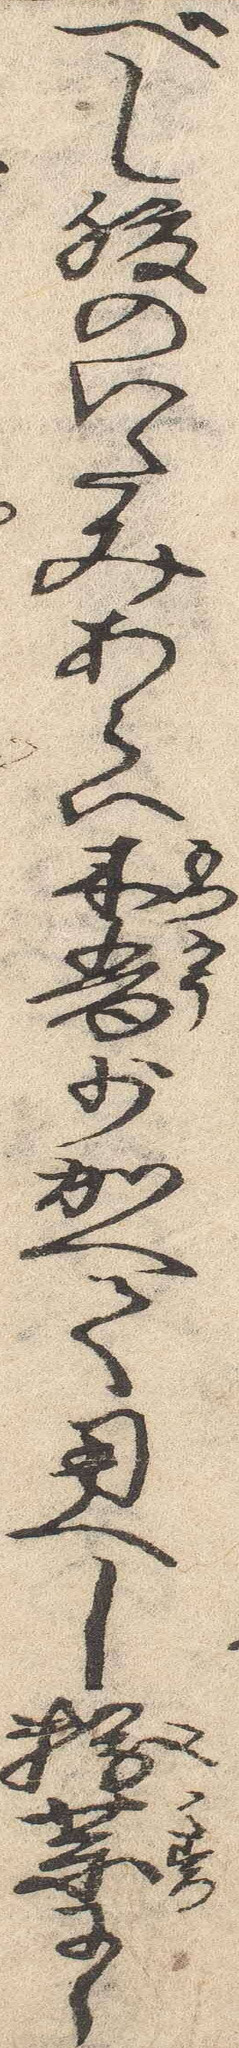べし腹のいたみあらは木香少加へて用へし粉薬にし
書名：小児必用養育草
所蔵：東京学芸大学附属図書館 国文学研究資料館
